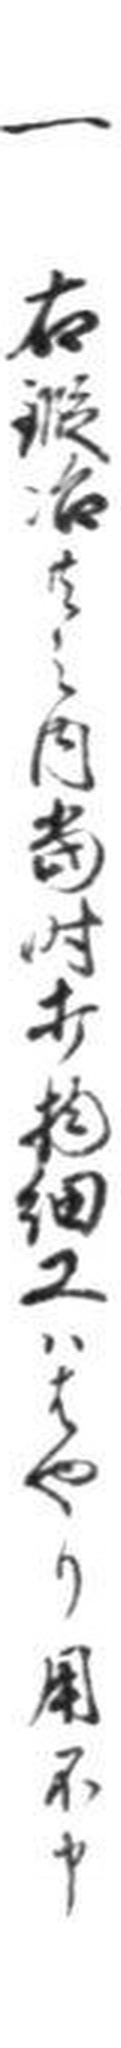一右鍛冶共之内当時打物細工ハはやり用不申
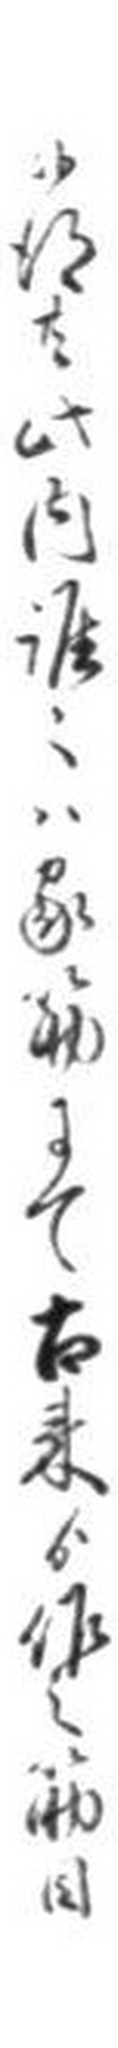候得共此内誰々ハ家筋にて古来ゟ作之筋目
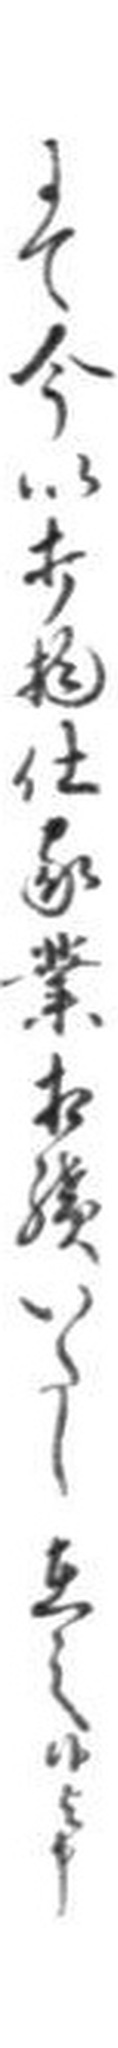にて今以打物仕家業相続いたし在之候与申
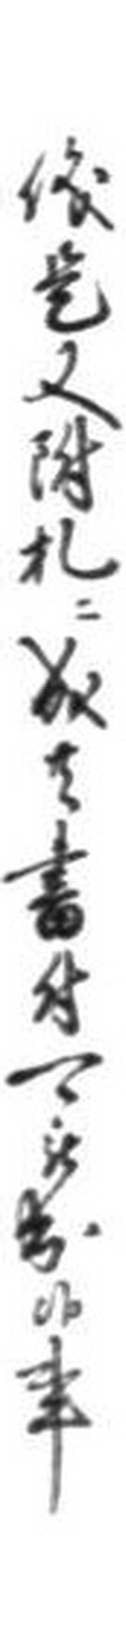儀是又付札ニ成共書付可被出候事
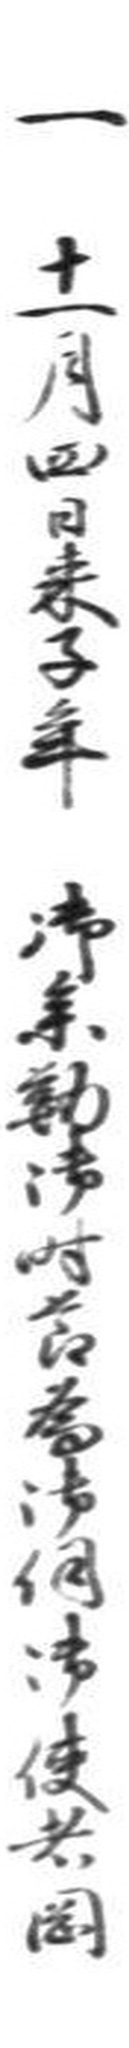一十一月四日来子年御参勤御時節為御伺御使者岡
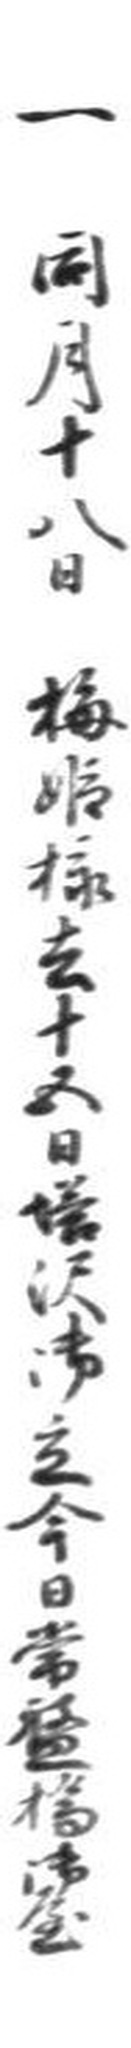一同月十八日梅姫様去十五日塔沢御立今日常盤橋御屋
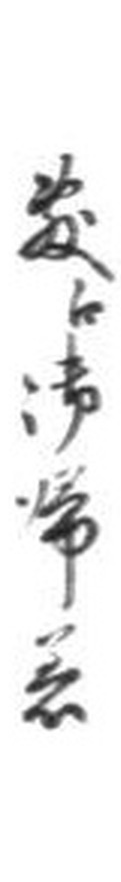敷江御帰着

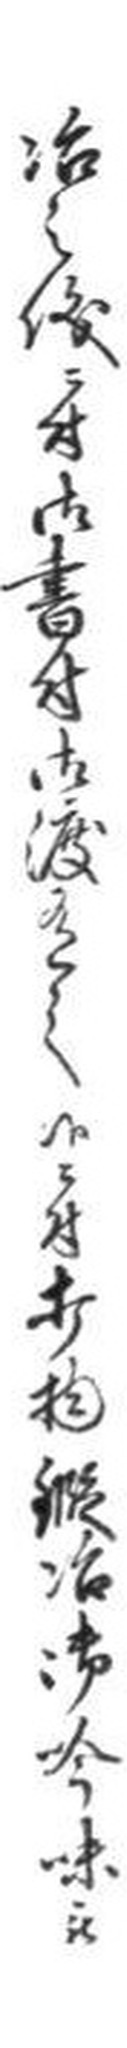冶之儀ニ付御書付御渡有之候ニ付打物鍛冶御吟味被
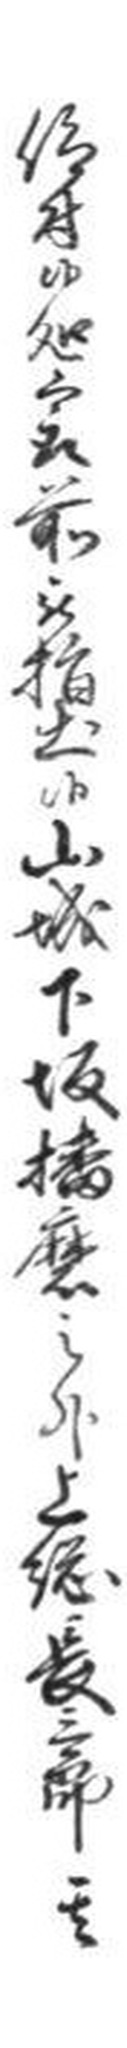仰付候処最前被指出候山城下坂播磨之外上総長三郎其
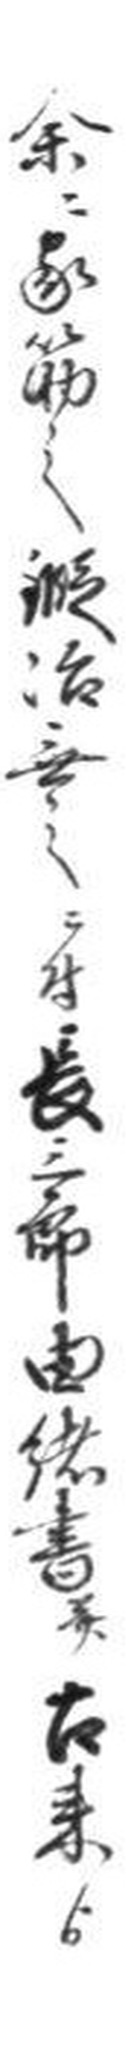余ニ家筋之鍛冶無之ニ付長三郎由緒書并古来ゟ
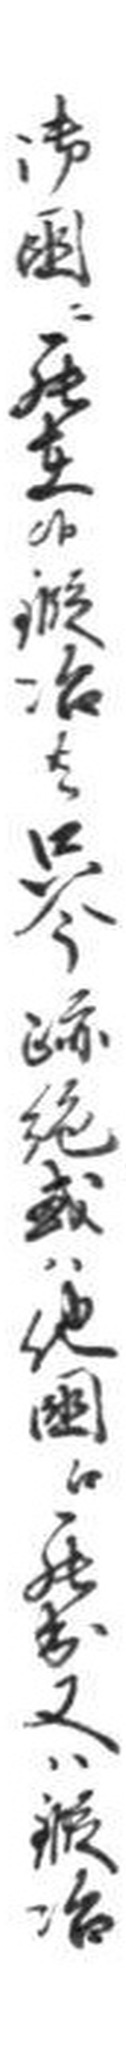御国ニ罷在候鍛冶共只今跡絶或ハ他国江罷出又ハ鍛冶
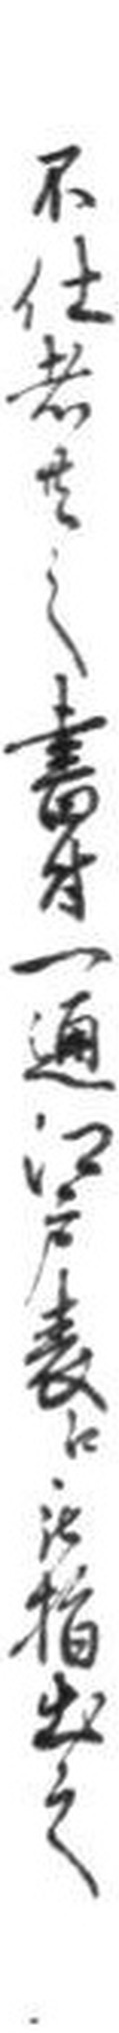不仕者共之書付一通江戸表江被指出之
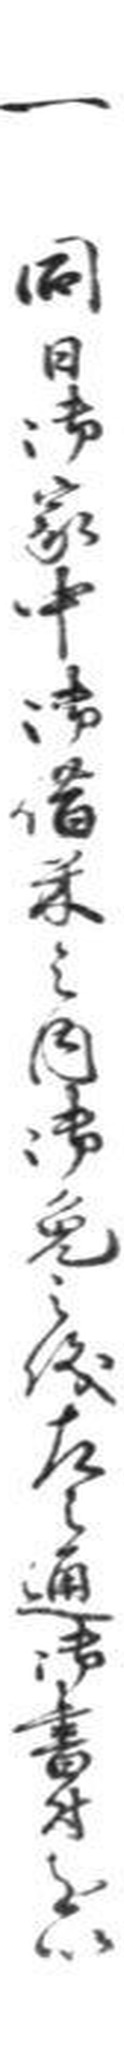一同日御家中御借米之内御免之儀左之通御書付を以
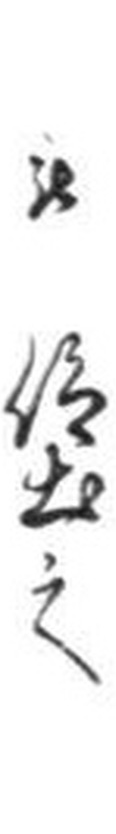被仰出之
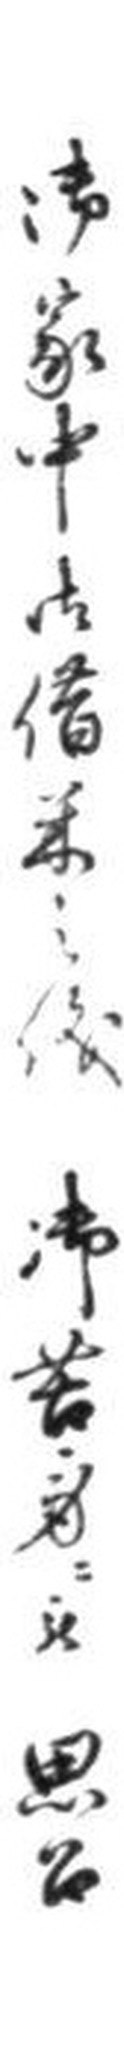御家中御借米之儀御苦身ニ被思召
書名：家譜 三十三 吉邦公 享保四年
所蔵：福井県文書館 Fukui Prefectural Archives
